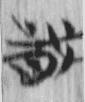歲（歲）
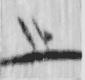之
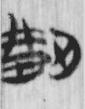○（荆）
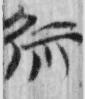𫵖
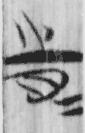之月
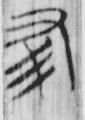○（盡）
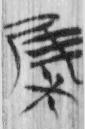集
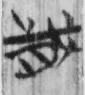歲（歲）
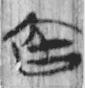竆（躬）
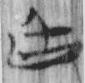身
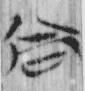尚
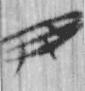母
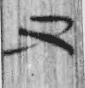又（有）
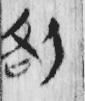咎
